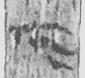七十=
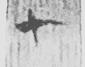七
